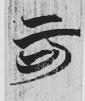可
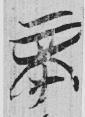不
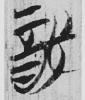戠（織）
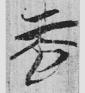而
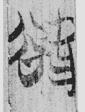欲
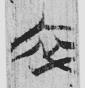衣
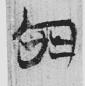含（今）
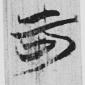可
